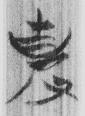尅
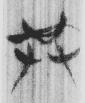共
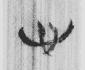心
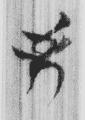茍
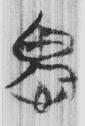愄
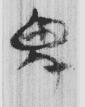畏
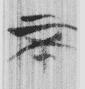不
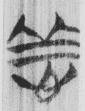恙
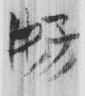{女呆}
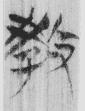教
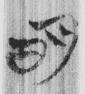明
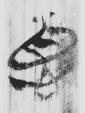惪
